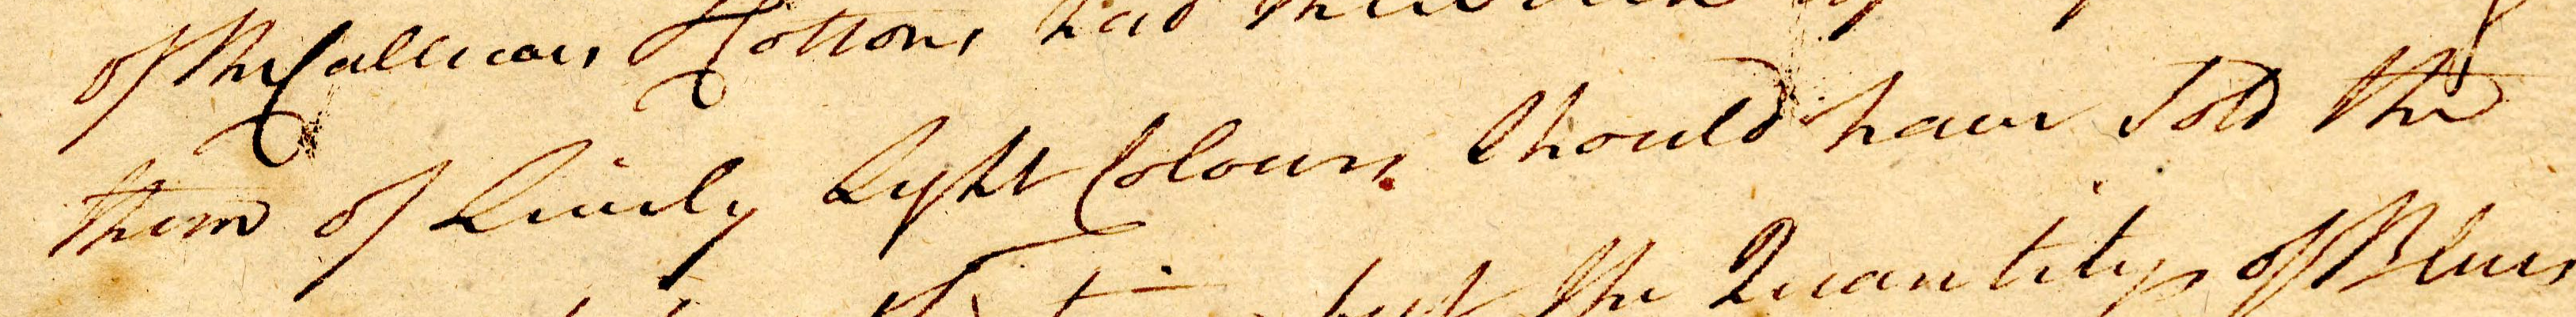them of lively Light Colour should have sold the
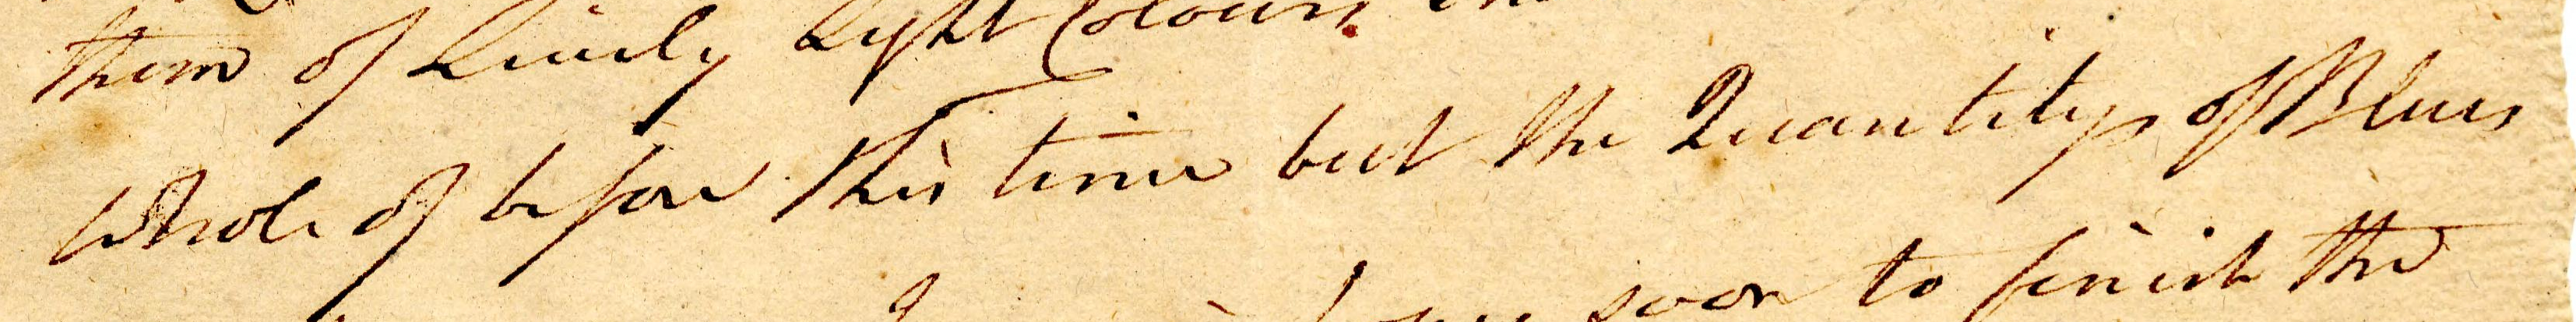Whole of before this time but the quantity of Blues
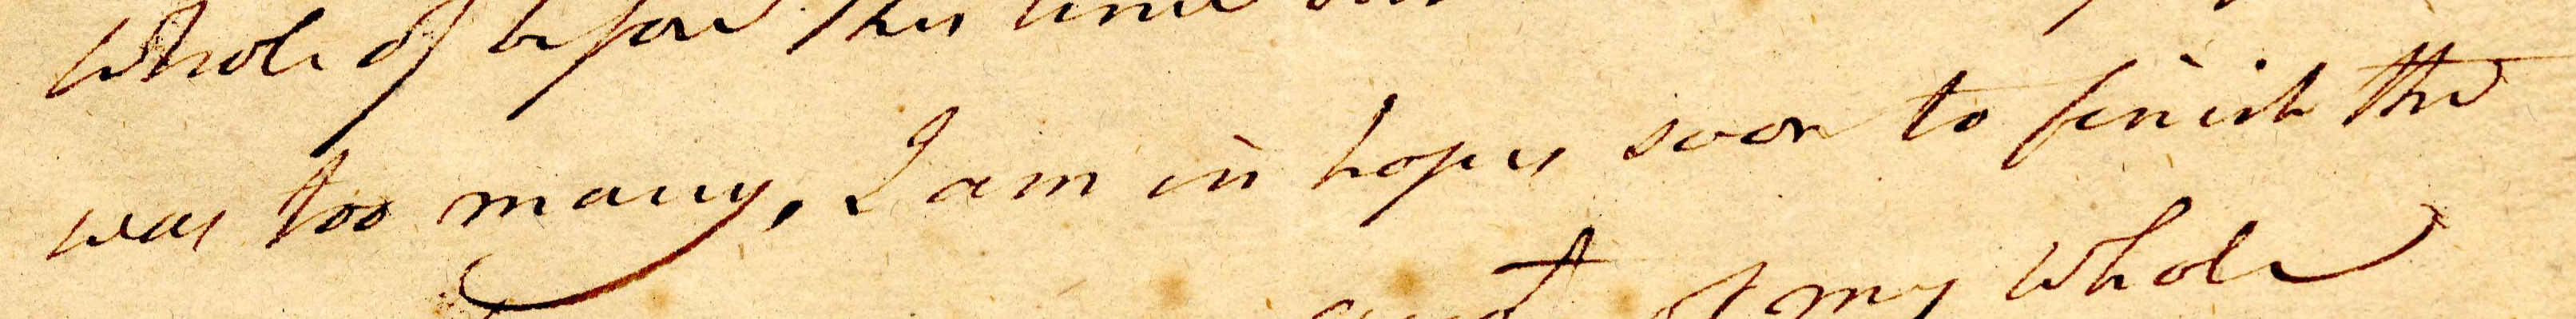was too many, I am in hopes soon to finish the
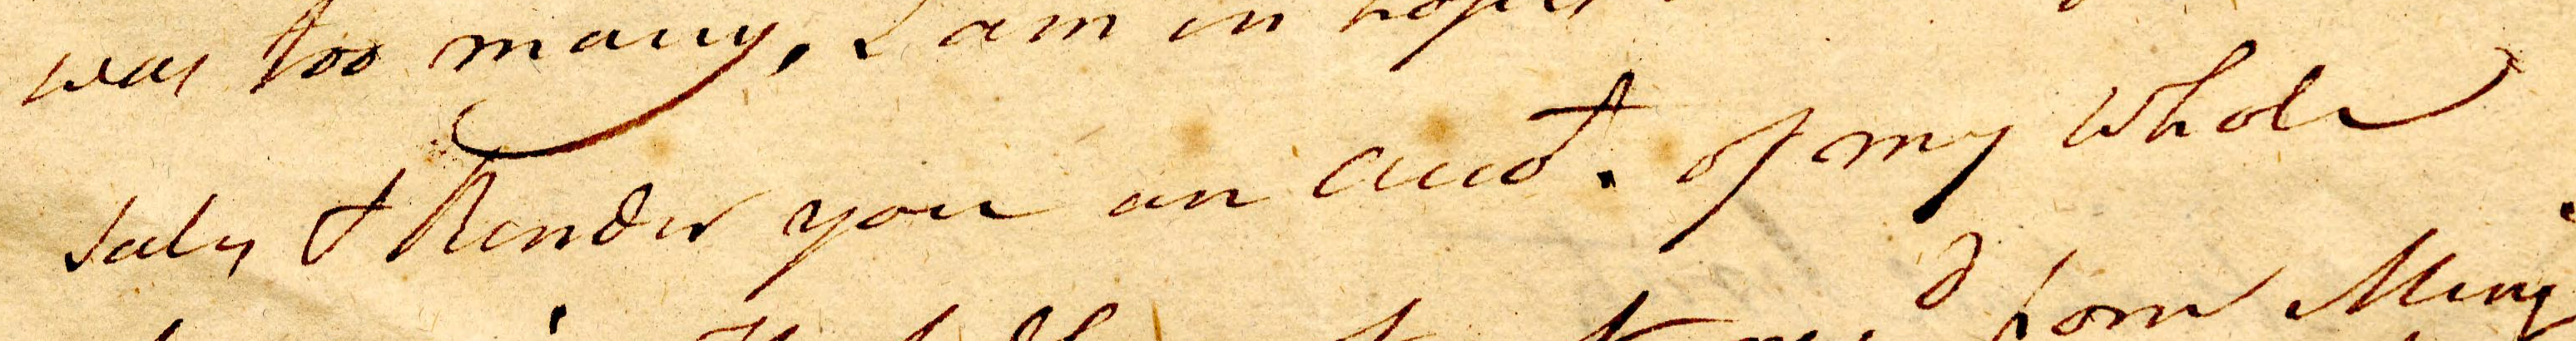sales & Render you an acco^t. of my whole
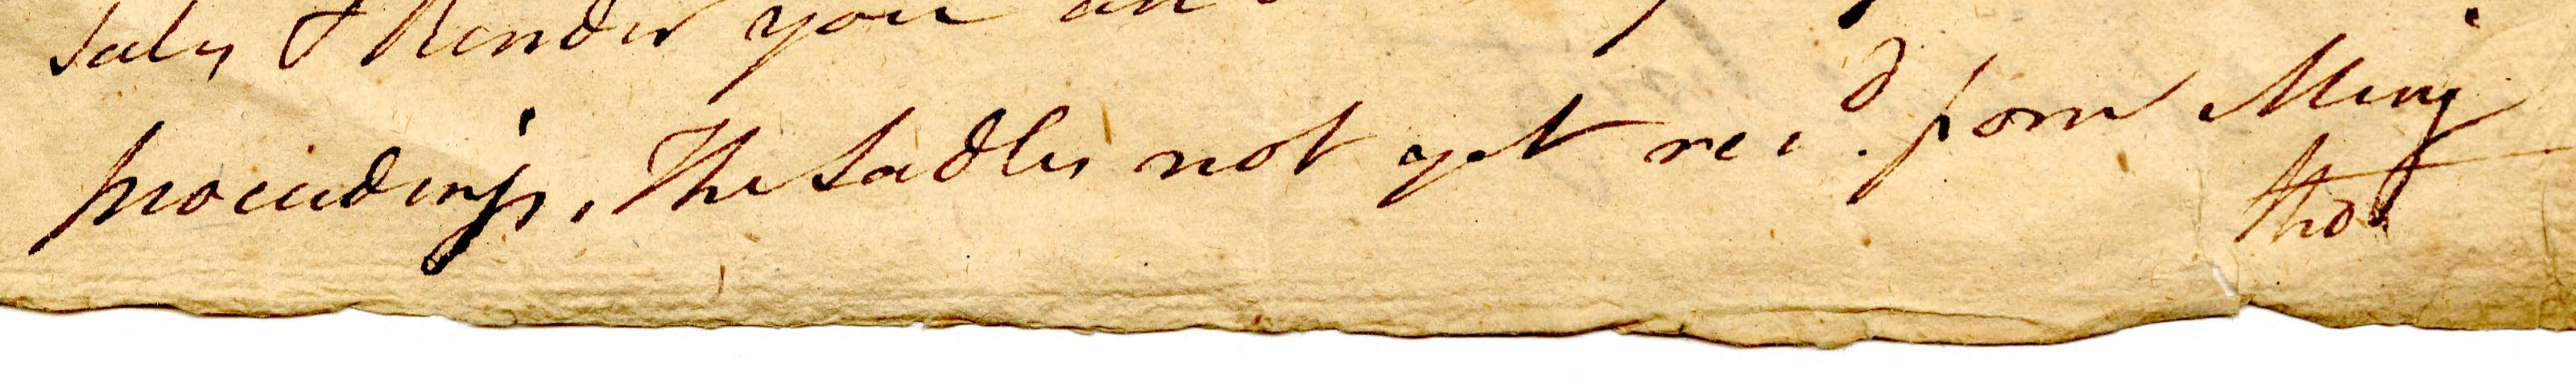proceeding. The sadles not yet rec^ from many
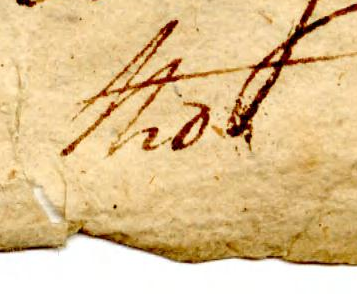tho
